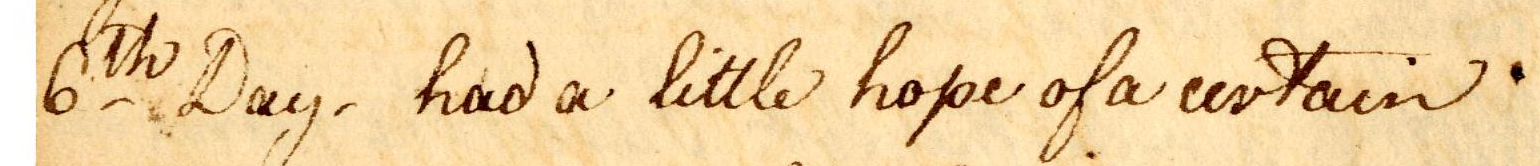6^th Day- had a little hope of a certain
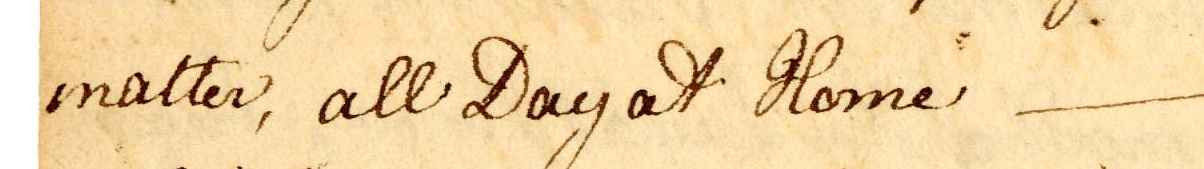matter, all Day at Home-
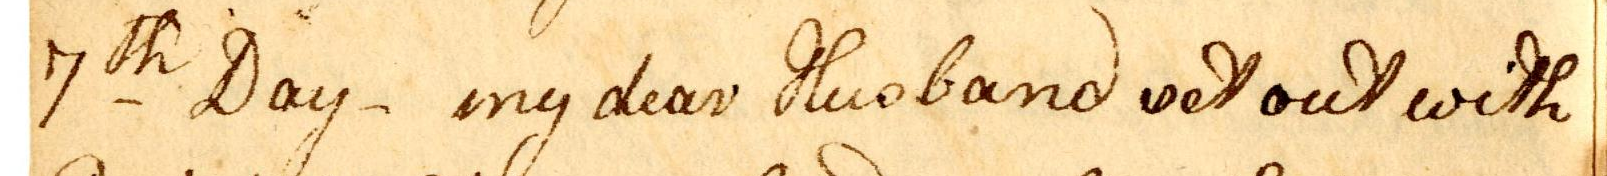7^th Day- my dear Husband set out with
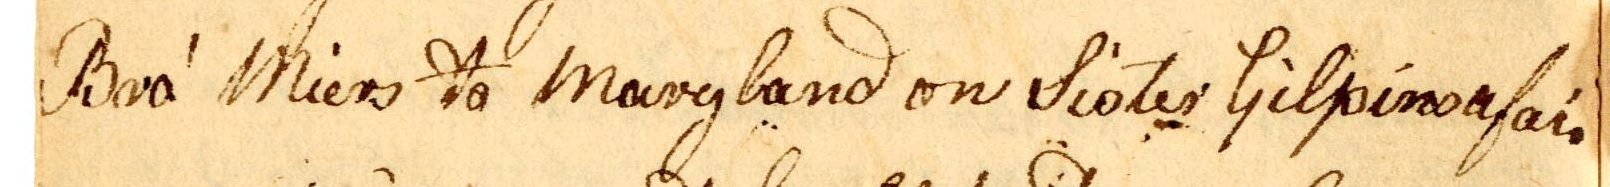Bro' Miers to Maryland on Sister Gilpins afair.
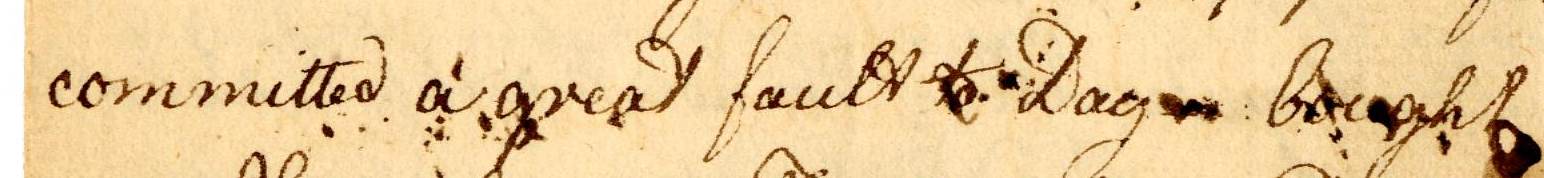committed a great fault to Day- bought
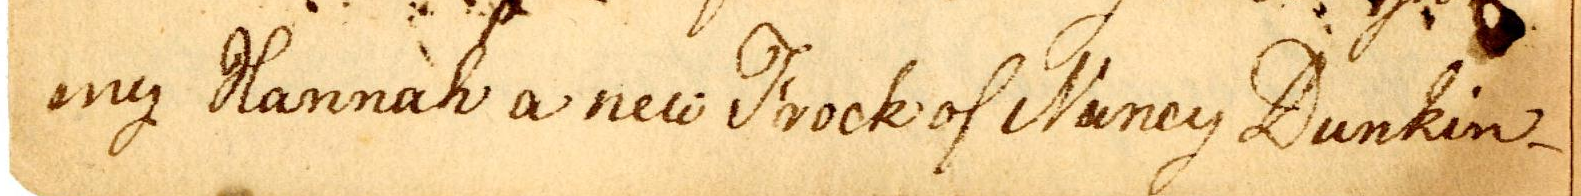my Hannah a new Frock of Nancy Dunkin-
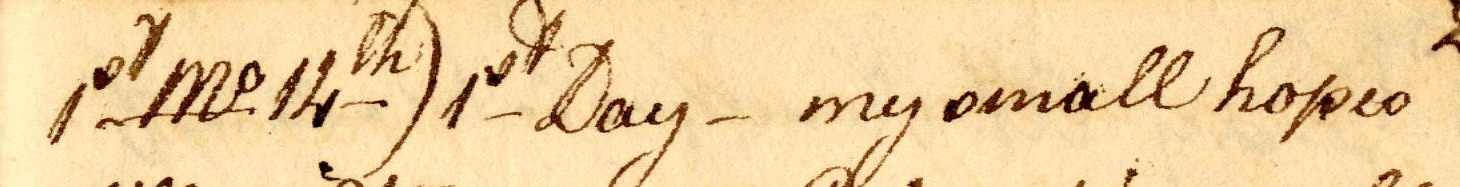1^st M^o 14^th) 1^st Day- my small hopes
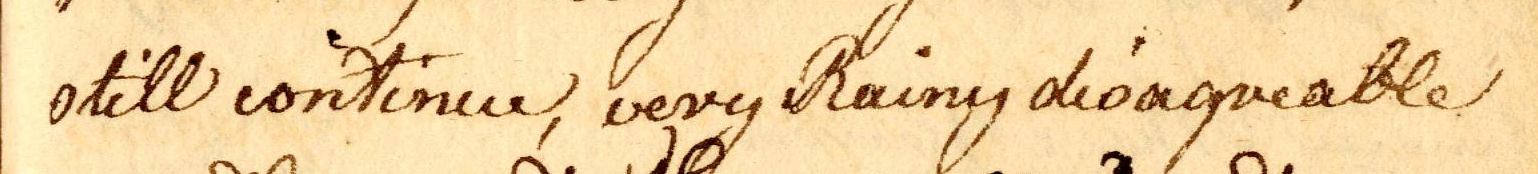still continue very Rainy disagreable
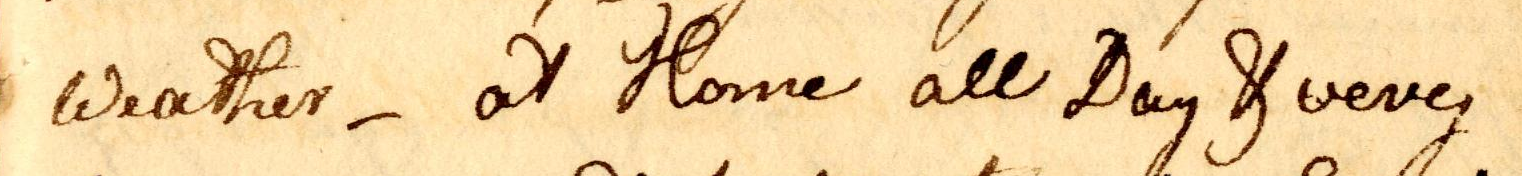Weather- at Home all Day & very
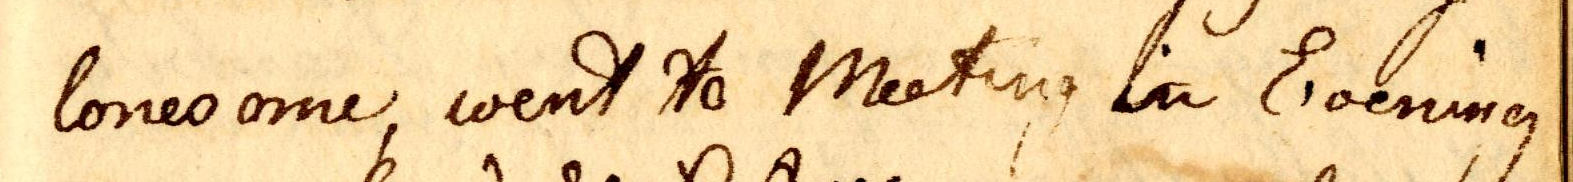lonesome, went to Meeting in Evening
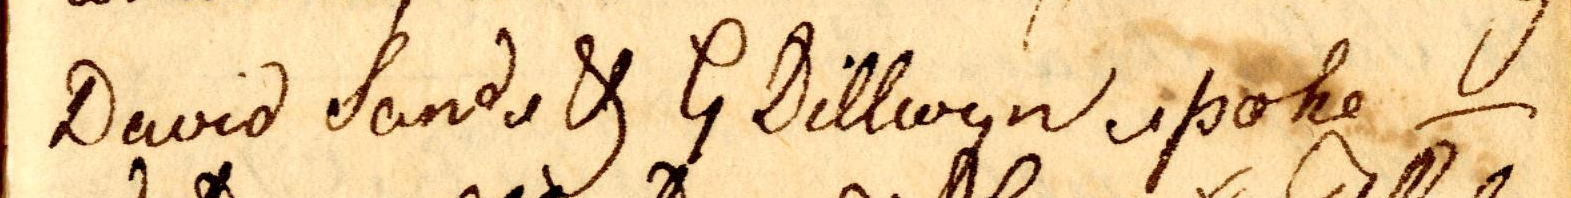David Sands & G Dillwyn spoke-
